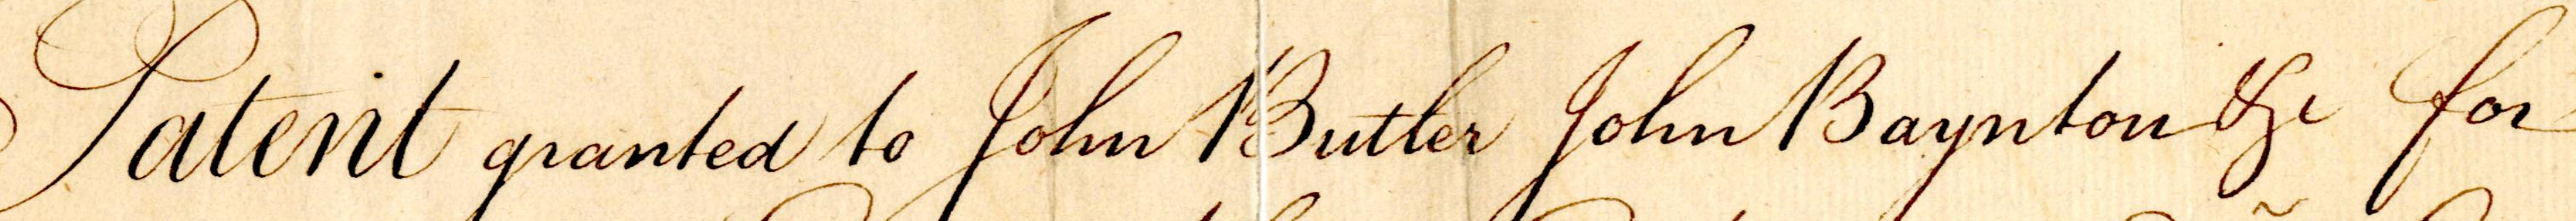Patent granted to John Butler John Baynton &c for
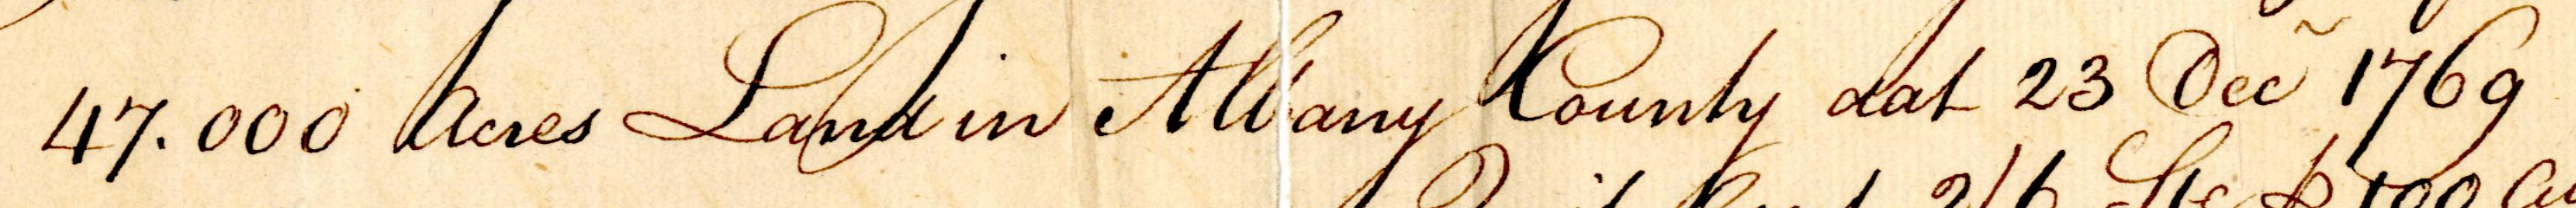47.000 acres Land in Albany County dat 23 Dec 1769
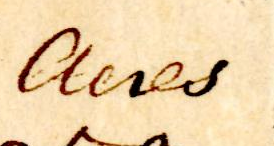Acres
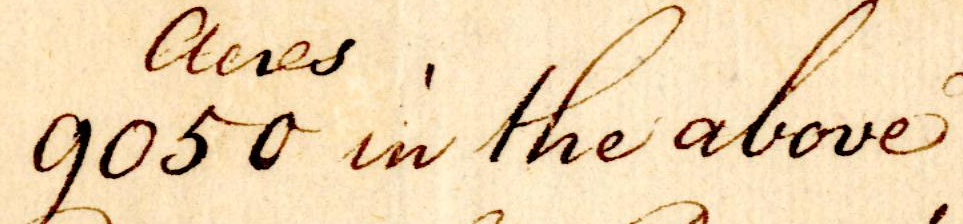9050 in the above
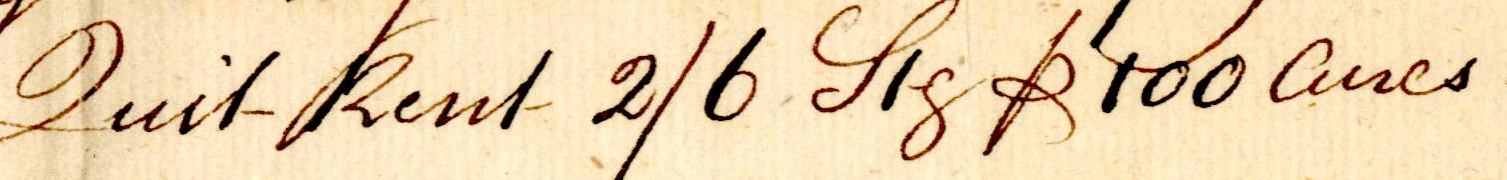Quit Rent 2s6 S18 per 100 acres
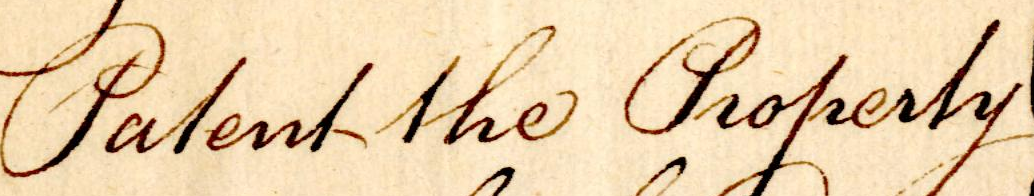Patent the Property
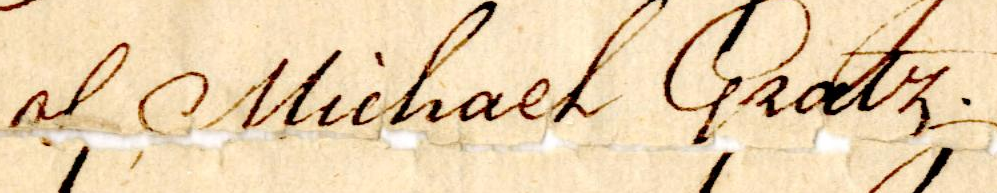of Michael Gratz
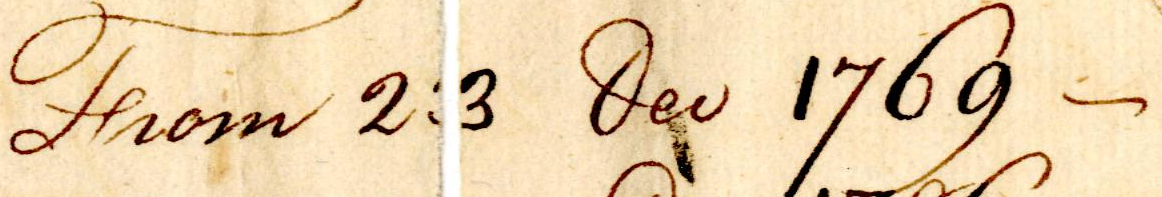From 23 Dec 1769-
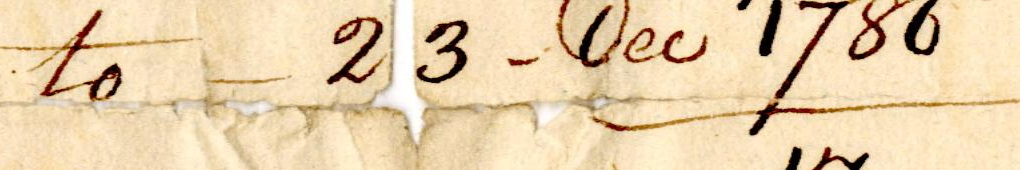20 23 Dec 1786
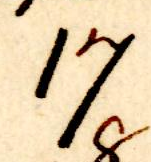17
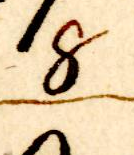8
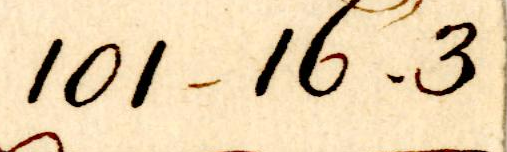101- 16.3
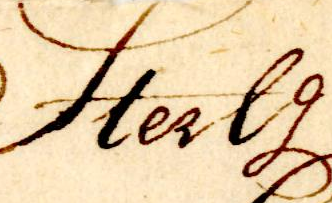Sterlg
